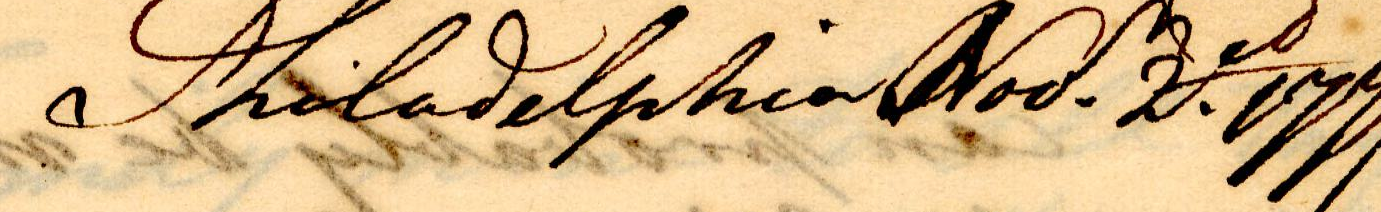Philadelphia Nov^r. 2^nd. 1777
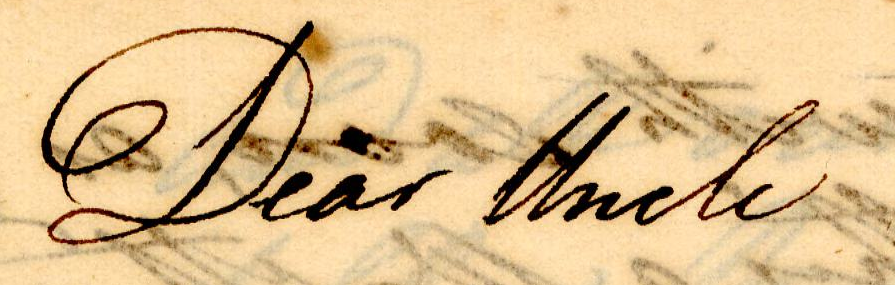Dear Uncle
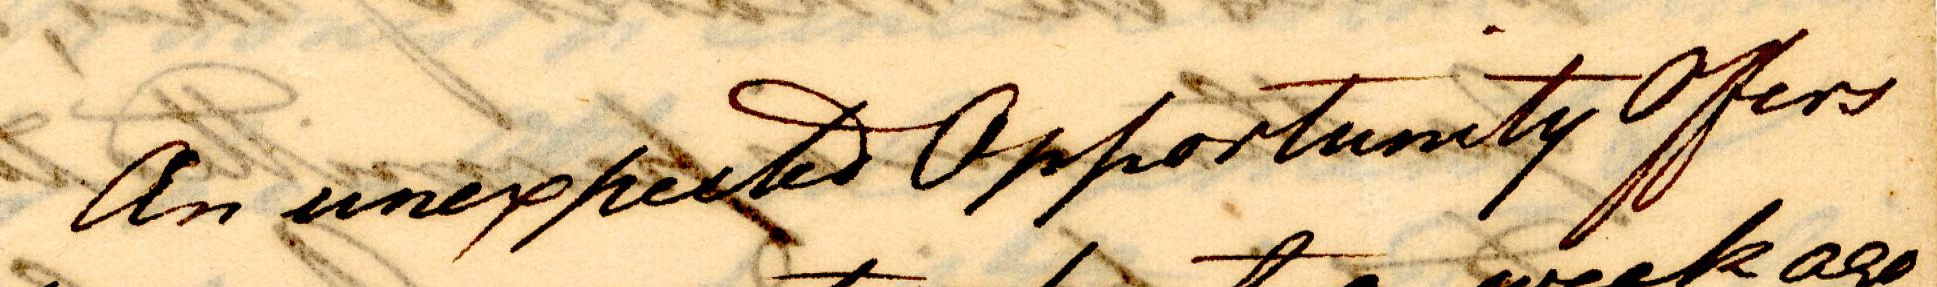An unexpected Opportunity Offers
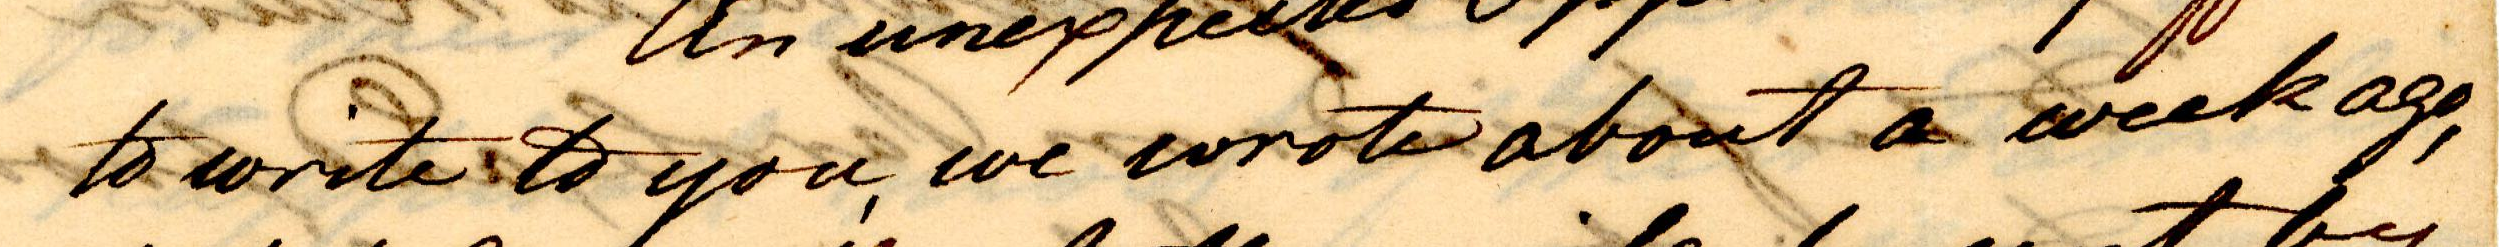to write to you, we wrote about a week ago,
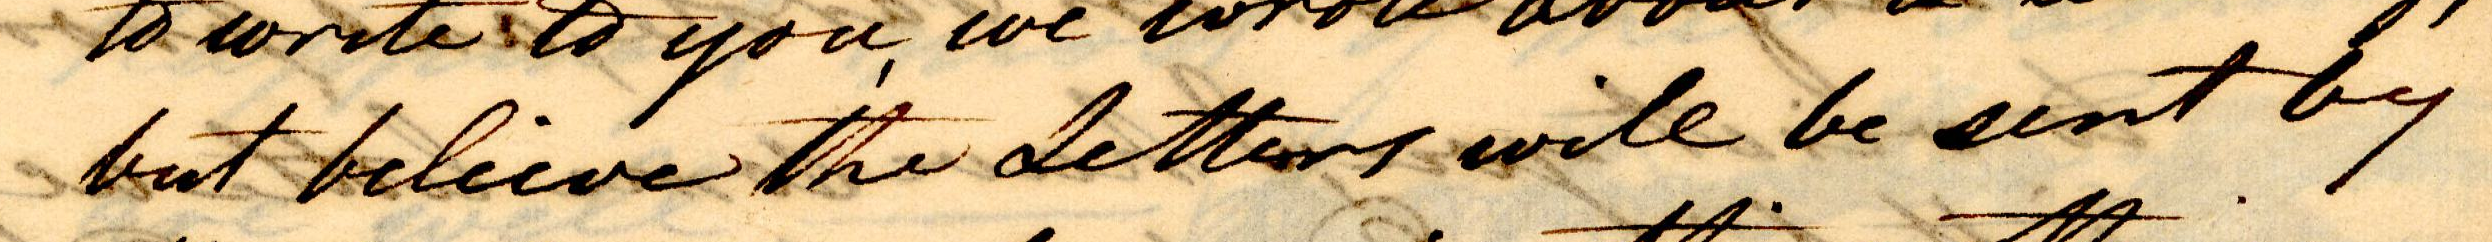but believe the Letters will be sent by
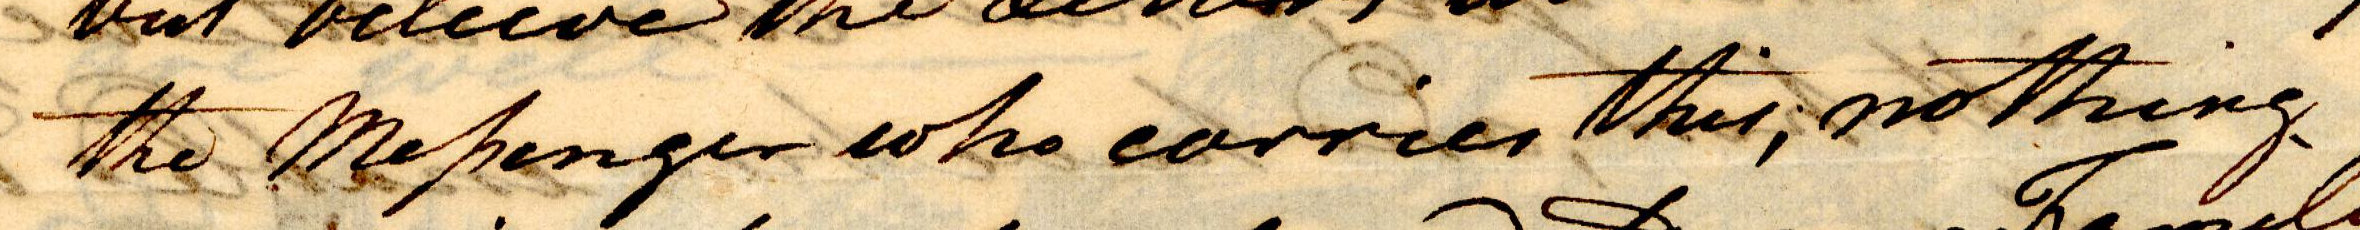the Messenger who carries this; nothing
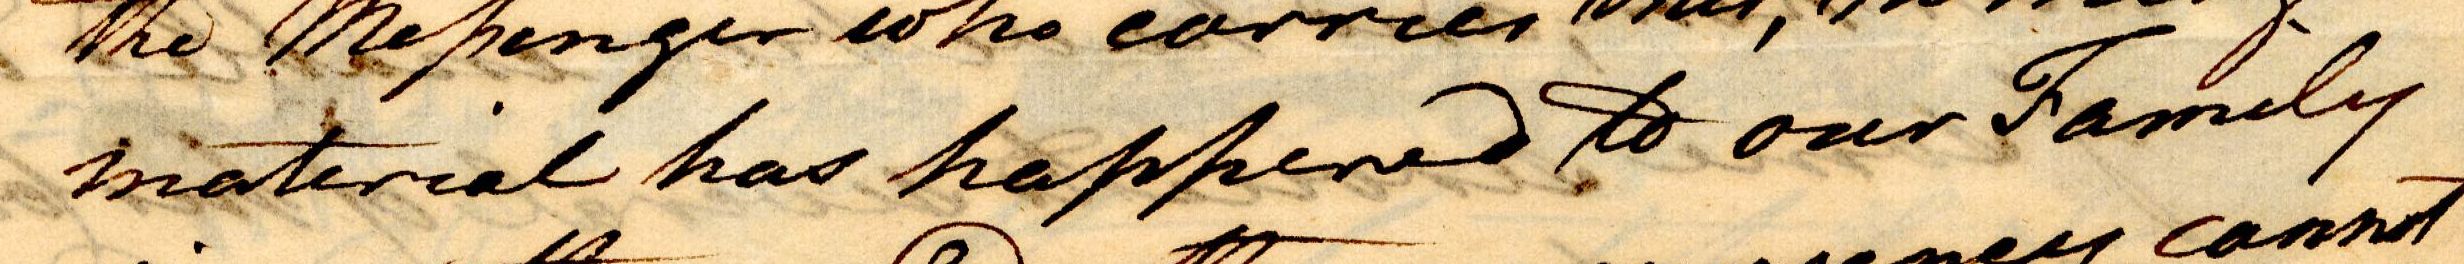material has happened to our Family
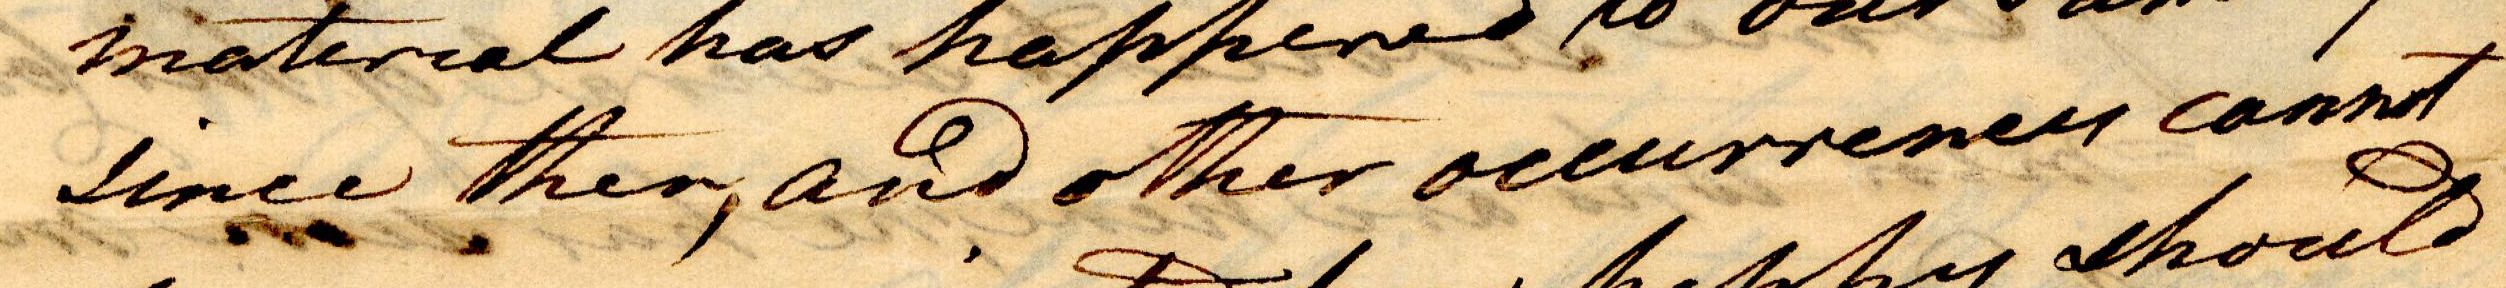since then, and other occurrences cannot
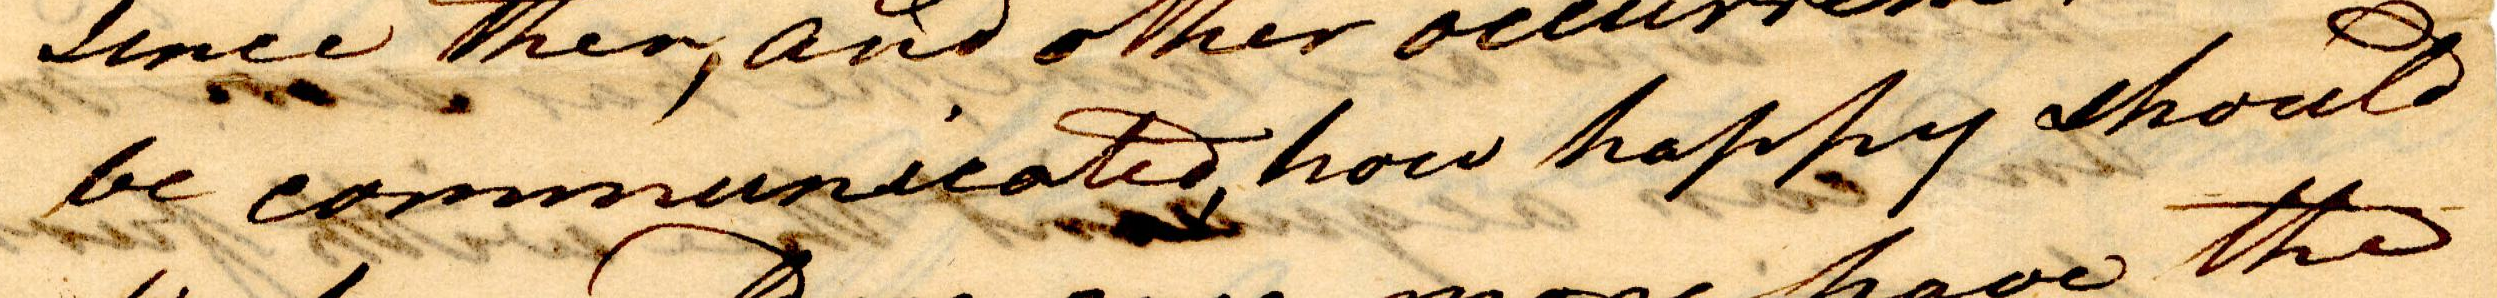be communicated, how happy should
